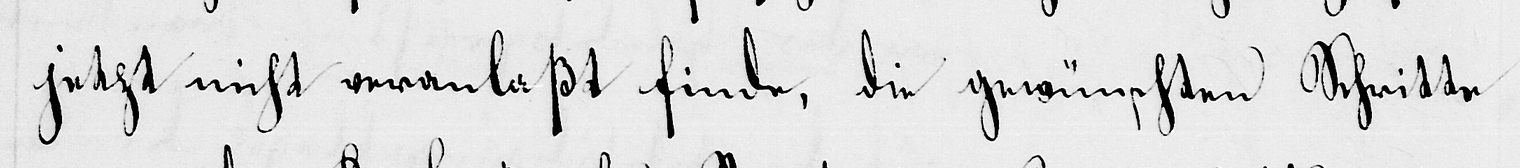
jetzt nicht veranlaßt finde, die gewünschten Schritte
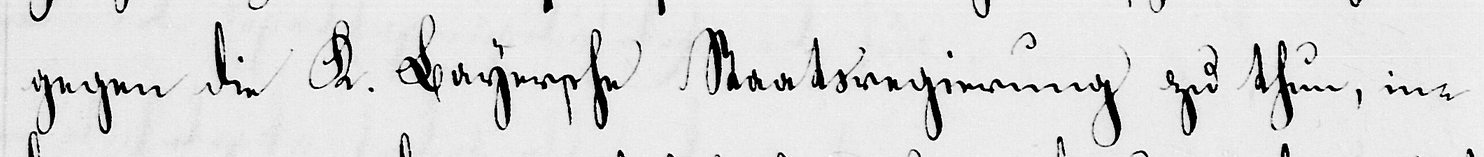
gegen die K. Bayersche Staatsregierung zu thun, in¬
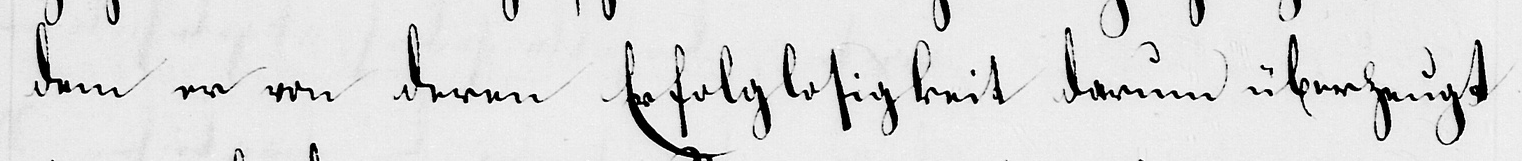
dem er von deren Erfolglosigkeit darum überzeugt
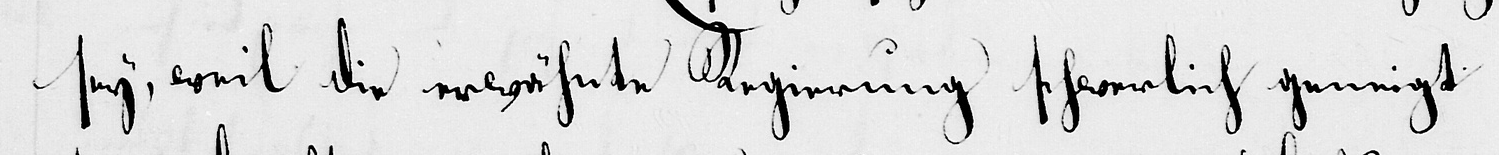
sey, weil die erwähnte Regierung schwerlich geneigt
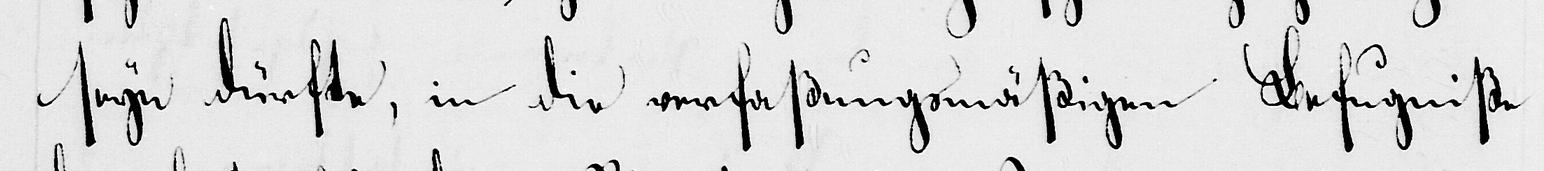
seyn dürfte, in die verfaßungsmäßigen Befugniße
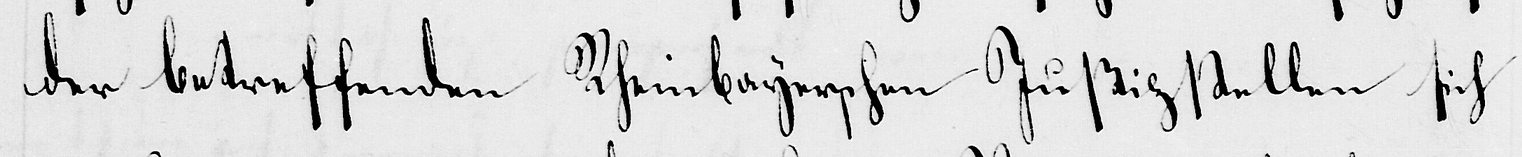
der betreffenden Rheinbayerschen Justizstellen sich
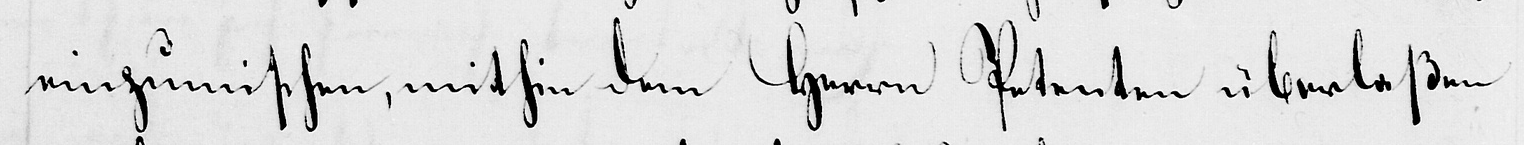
einzumischen, mithin dem Herrn Petenten überlaßen
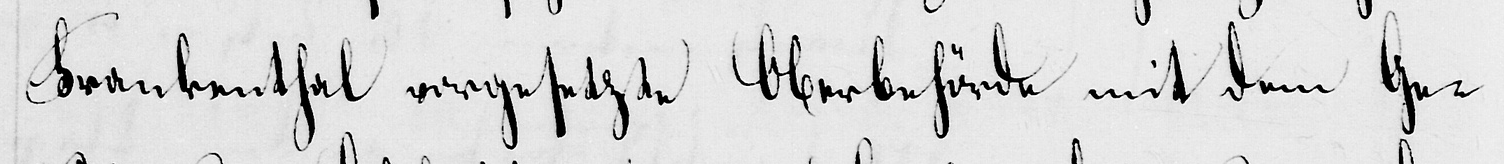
Frankenthal vorgesetzte Oberbehörde mit dem Ge¬
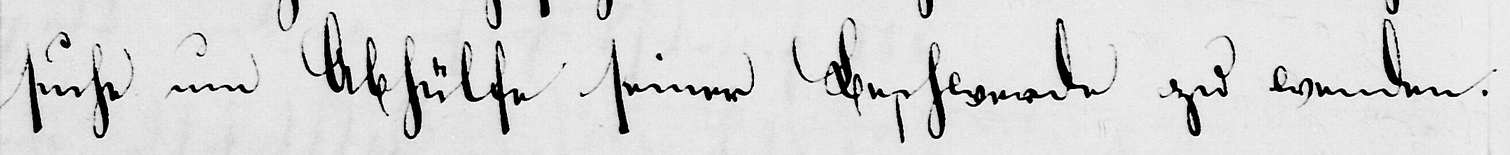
suche um Abhülfe seiner Beschwerde zu wenden.
